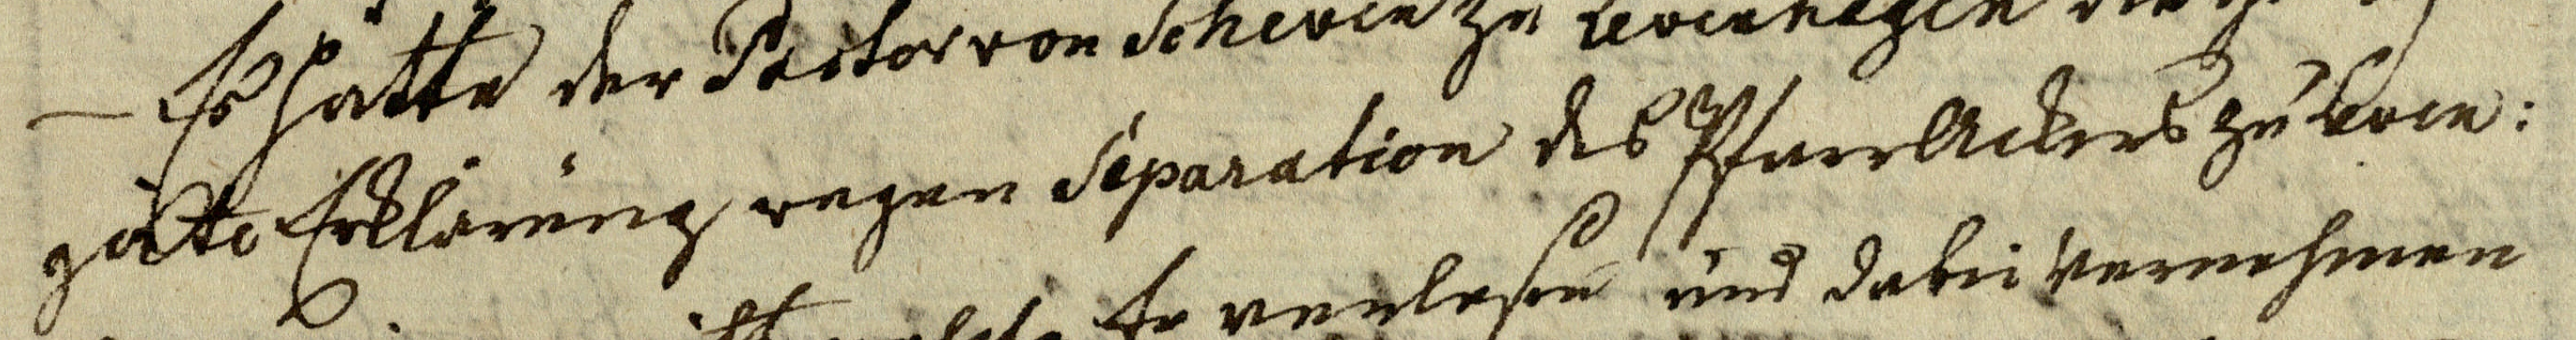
girte Erklärung wegen Separation des Pfarrackers zu Leven¬
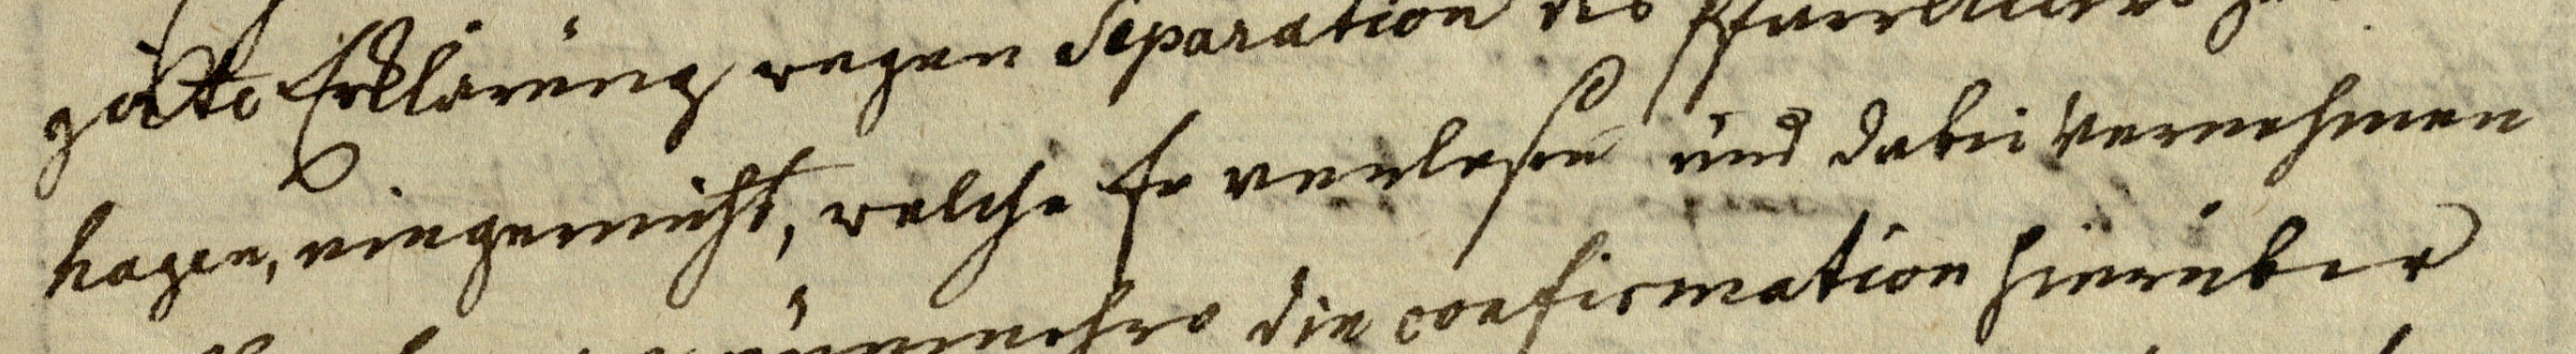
hagen, eingereicht, welche Er verlesen und dabei vernehmen
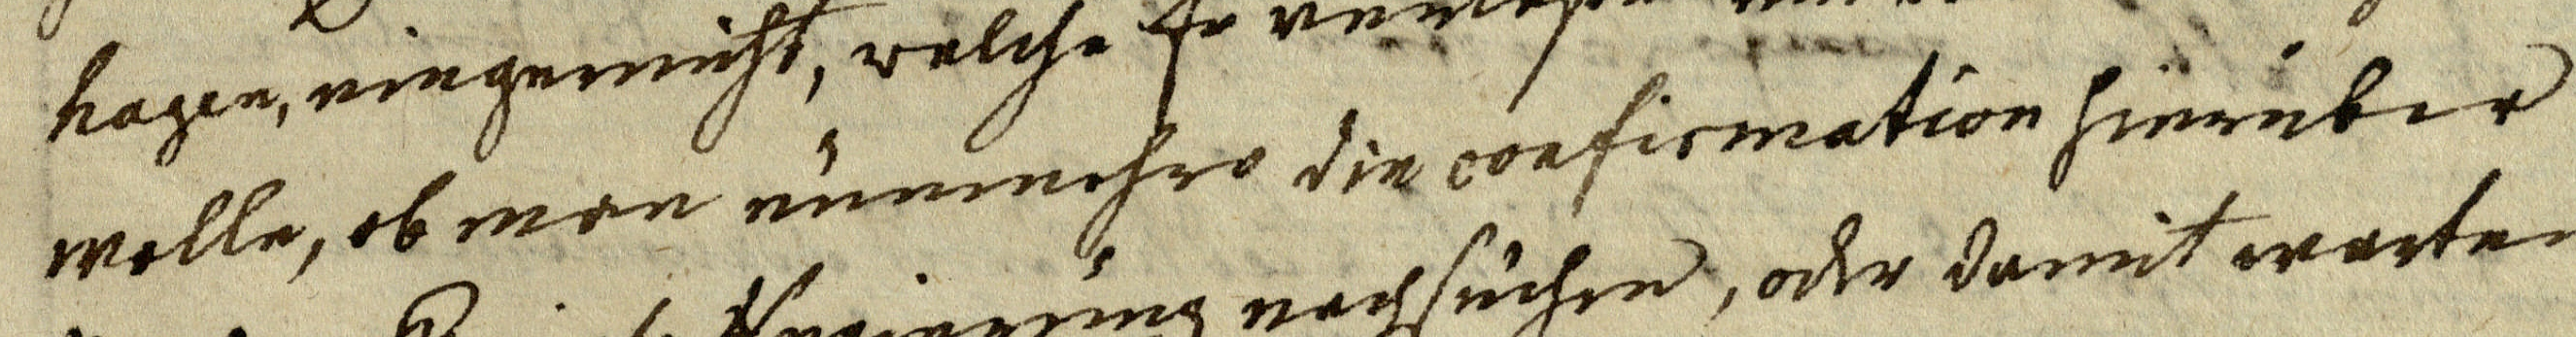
wolle, ob man nunmehro die confirmation hierüber
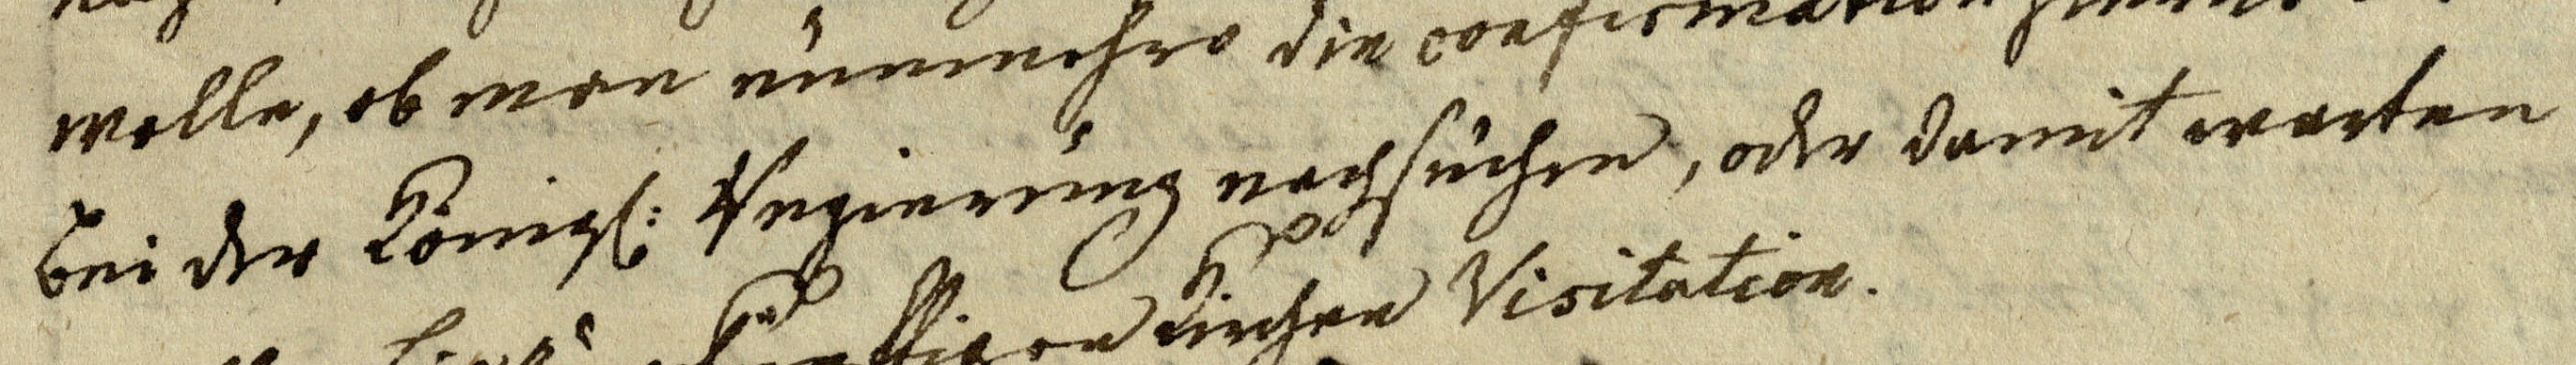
bei der Königl. Regierung nachsuchen, oder damit warten
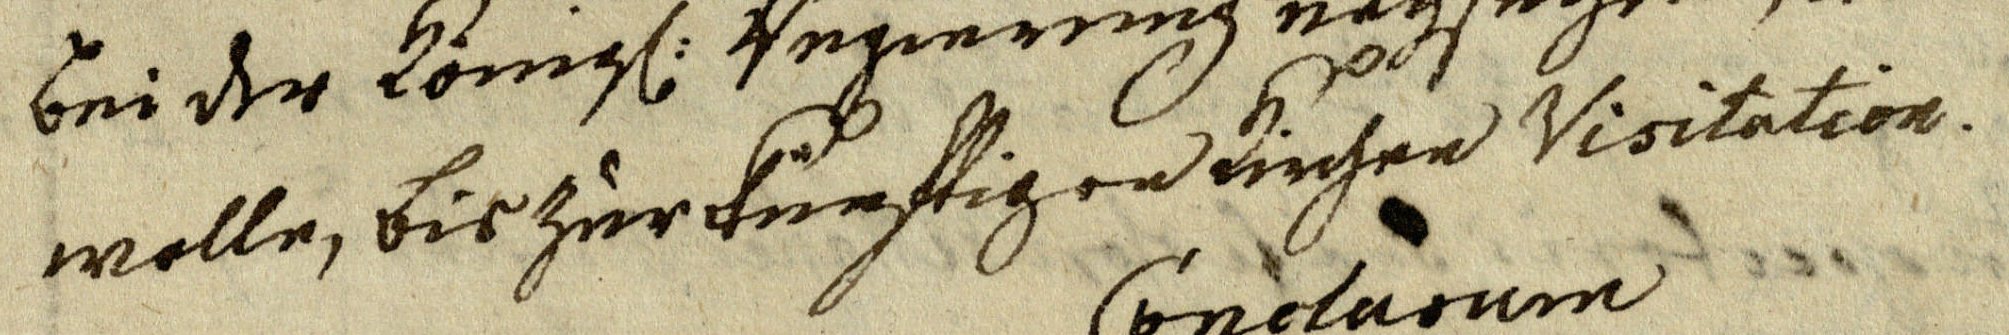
wolle, bis zur künftigen Kirchen Visitation.
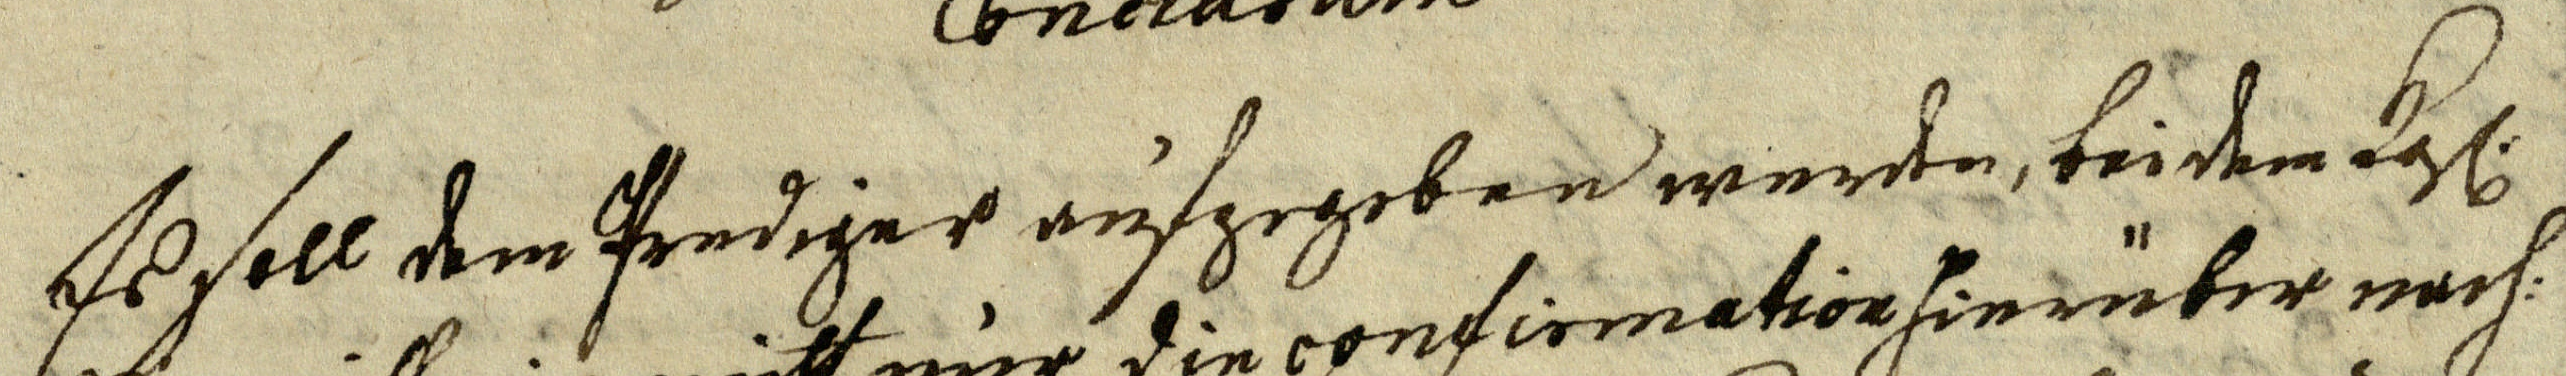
Es soll dem Prediger aufgegeben werden, bei dem Kgl.
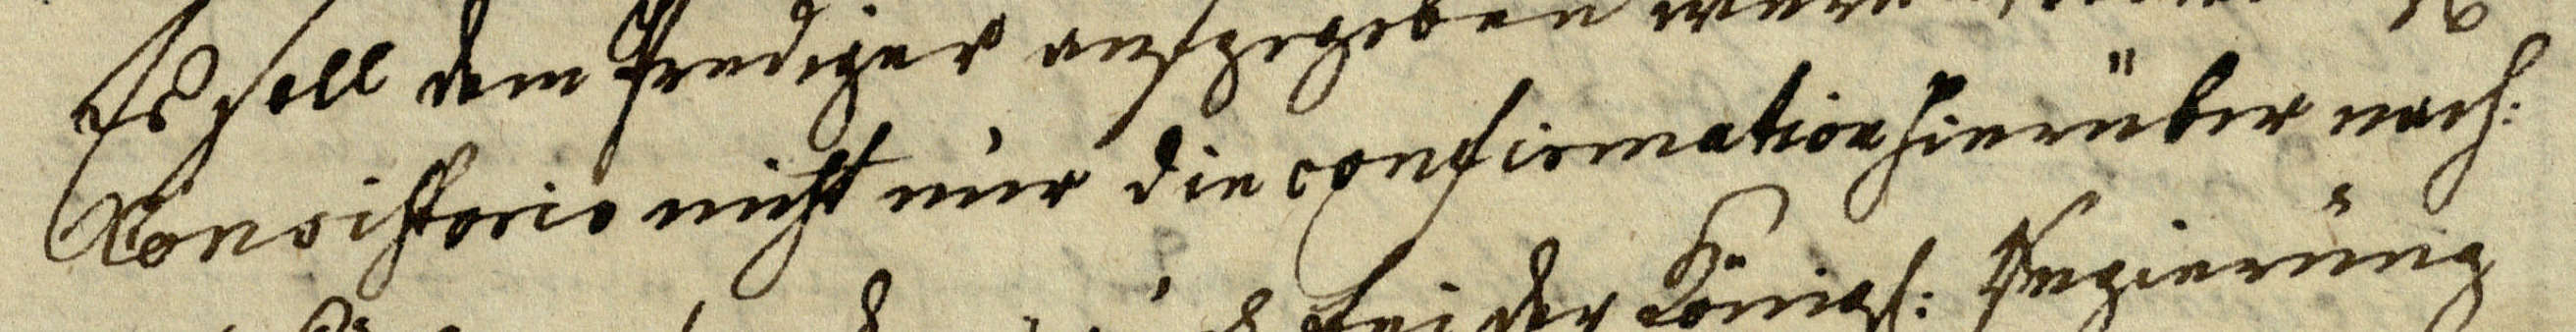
Consistorio nicht nur die confirmation hierüber nach¬
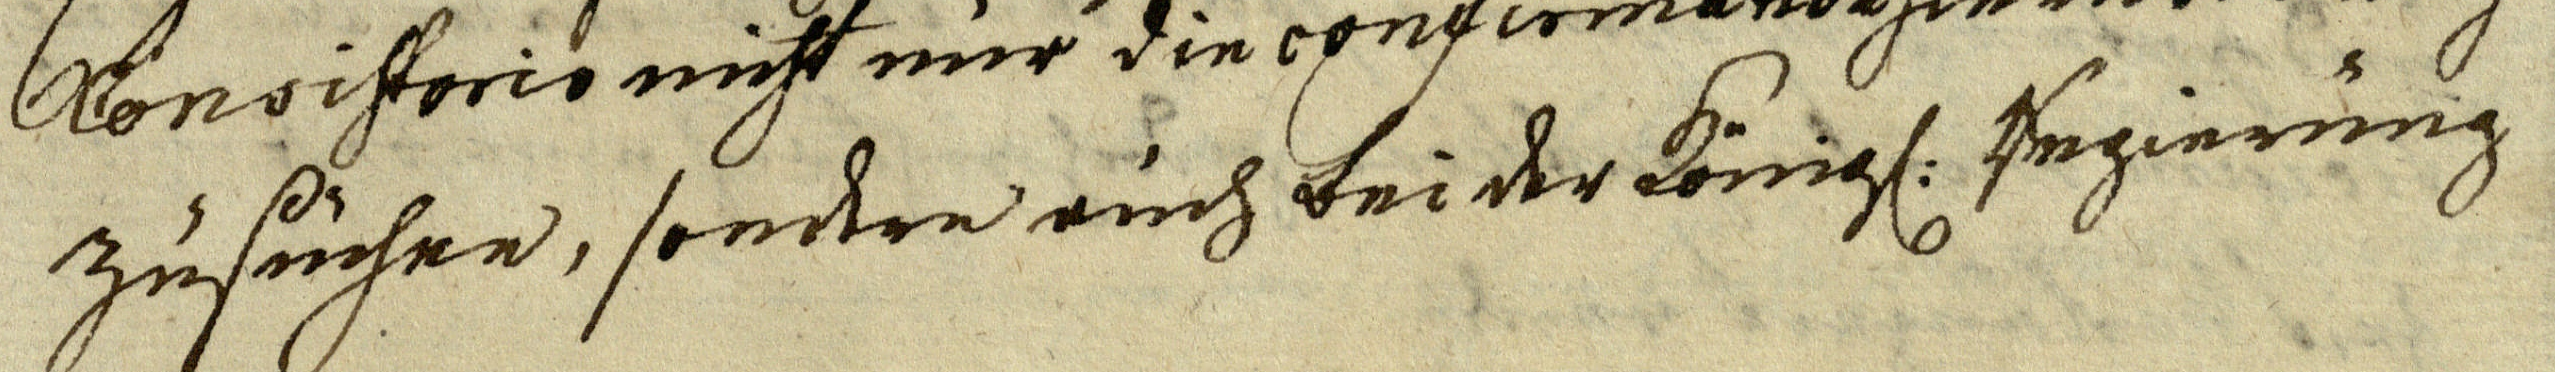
zusuchen, sondern auch bei der Königl. Regierung
